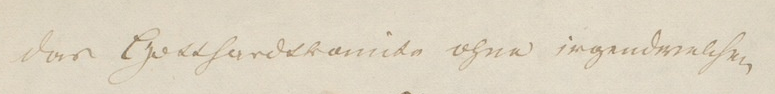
das Gotthardtkomite ohne irgendwelchen
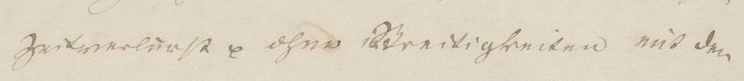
Zeitverlurst & ohne Streitigkeiten mit den
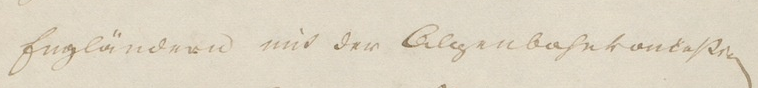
Engländern mit der Alpenbahnkonceßion
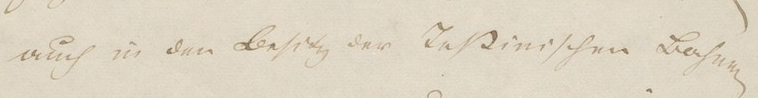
auch in den Besitz der Teßinischen Bahnen
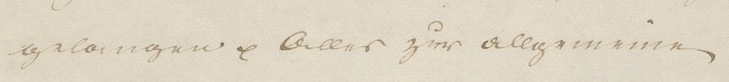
gelangen & Alles zur allgemeinen
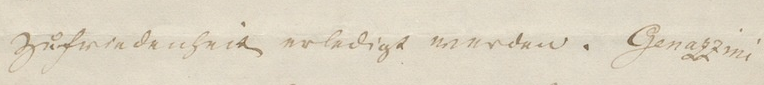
Zufriedenheit erledigt werden. Genazzini
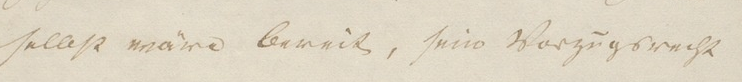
selbst wäre bereit, sein Vorzugsrecht
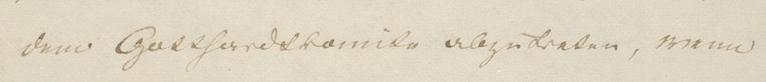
dem Gotthardtkomite abzutreten, wenn
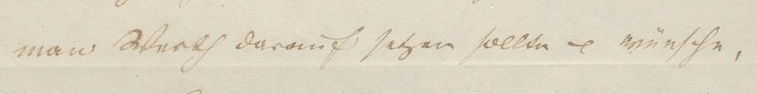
man Werth darauf setzen sollte & wünsche,
